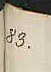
83.
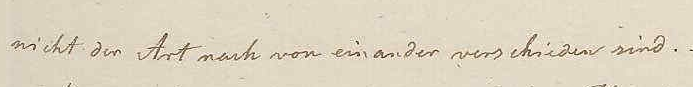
nicht der Art nach von einander verschieden sind. –
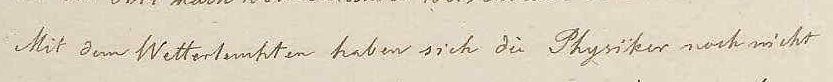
Mit dem Wetterleuchten haben sich die Physiker noch nicht
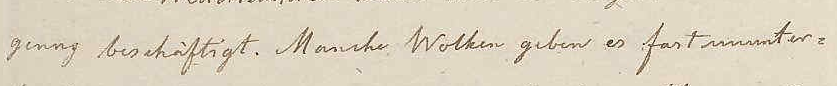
genug beschäftigt. Manche Wolken geben es fast ununter-
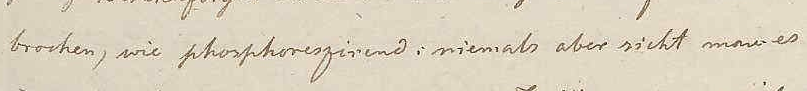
brochen, wie phosphoreszirend: niemals aber sieht man es
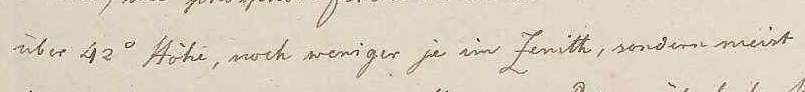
über 42° Höhe, noch weniger je im Zenith, sondern meist
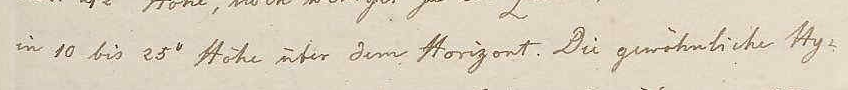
in 10 bis 25° Höhe über dem Horizont. Die gewöhnliche Hy-
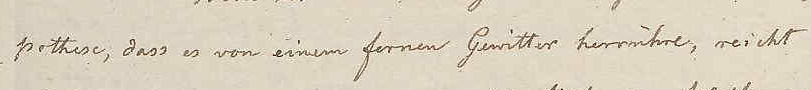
pothese, dass es von einem fernen Gewitter herrühre, reicht
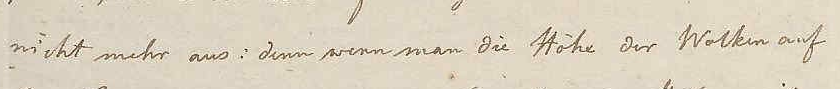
nicht mehr aus: denn wenn man die Höhe der Wolken auf
